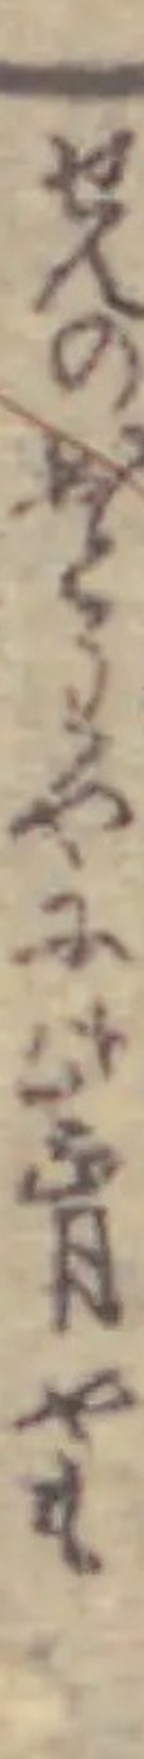せんのおとわやに此正月やも
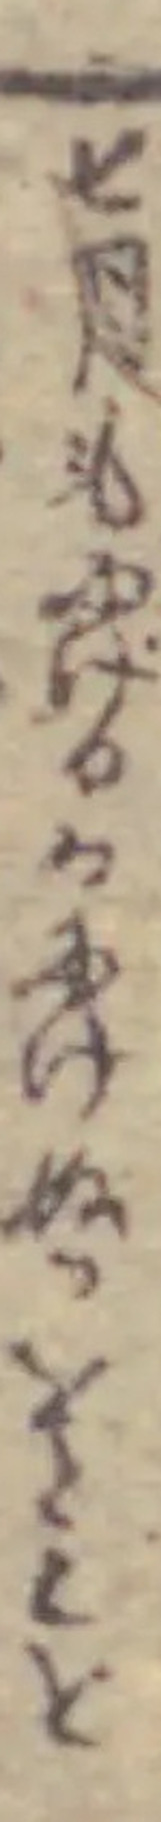七月もにげるかにけぬかをとこを
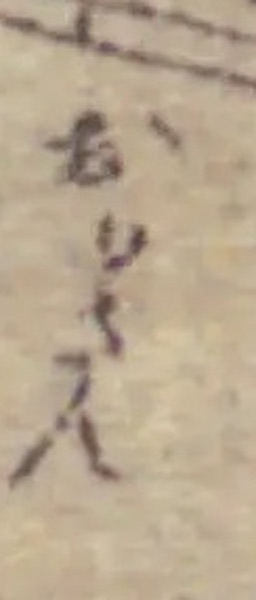おかさん
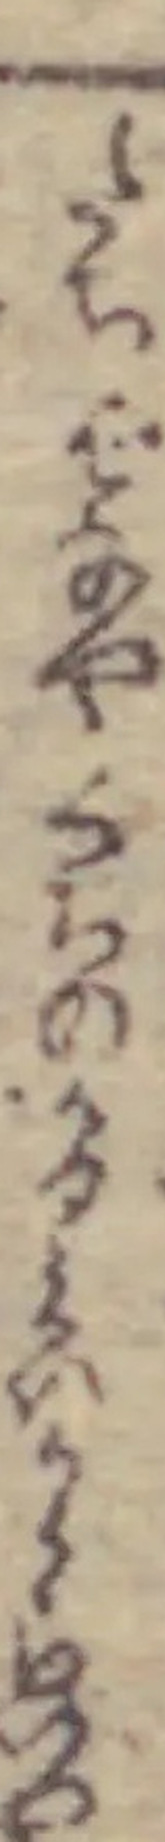たちばなやくちのかるみはいはとや
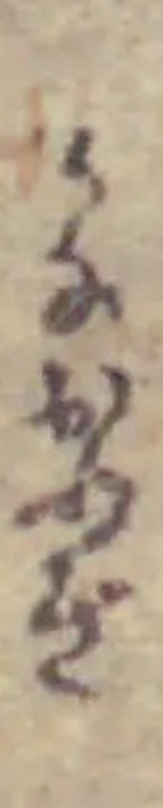かなおふぎ
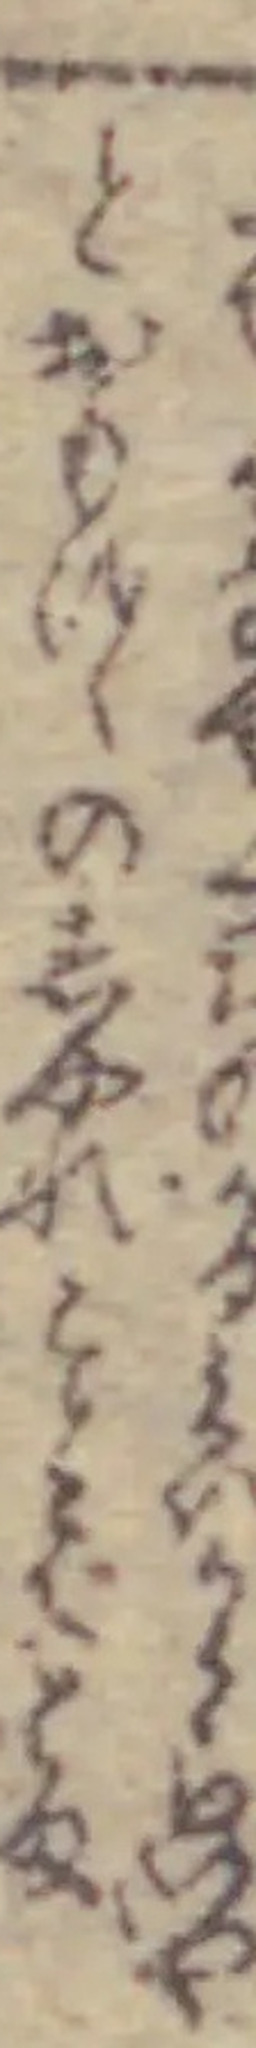とおもひ〳〵のしやれことばはま
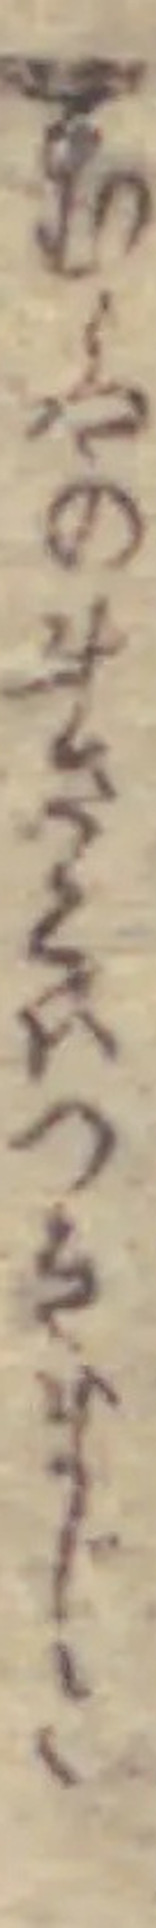むらやのまさこはつきまじと
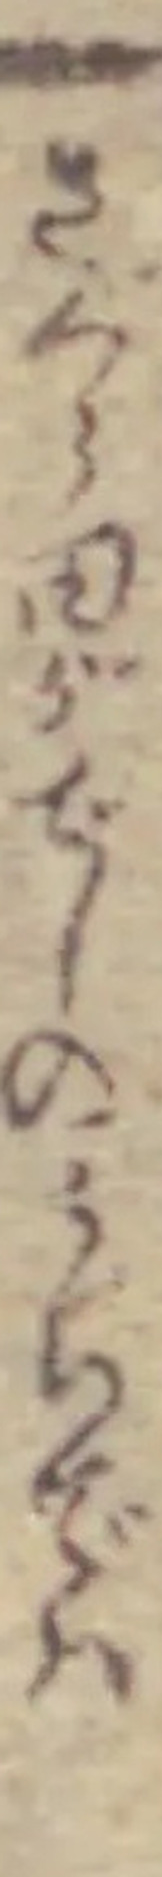さくら田がでしのうちでは
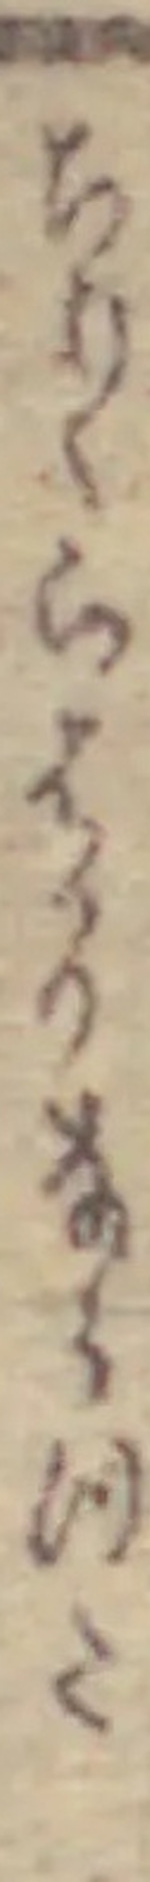ちよ〳〵らはかりならつた
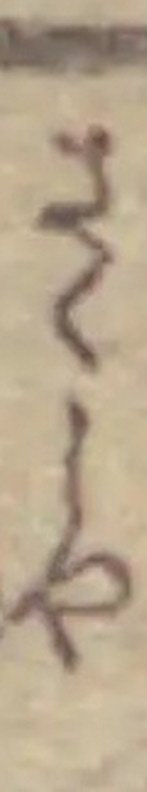さくしや
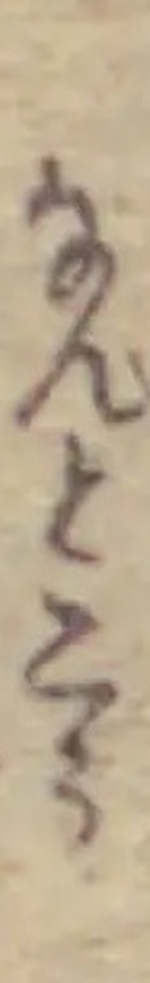なんとこう
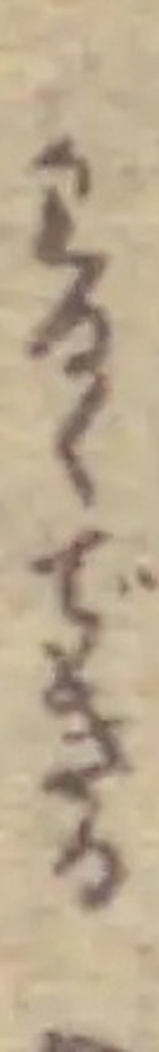わるくできる
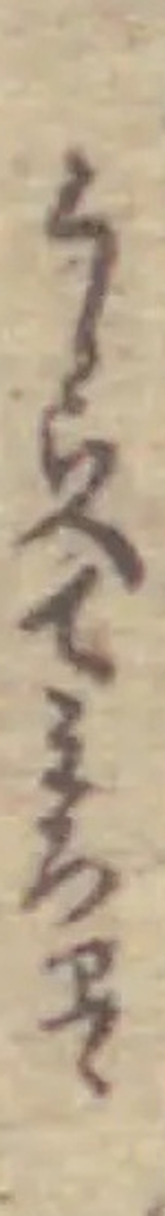こしらへてみろヱヽ

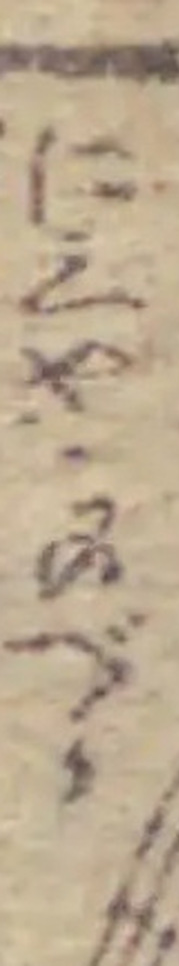仁三やこのべら
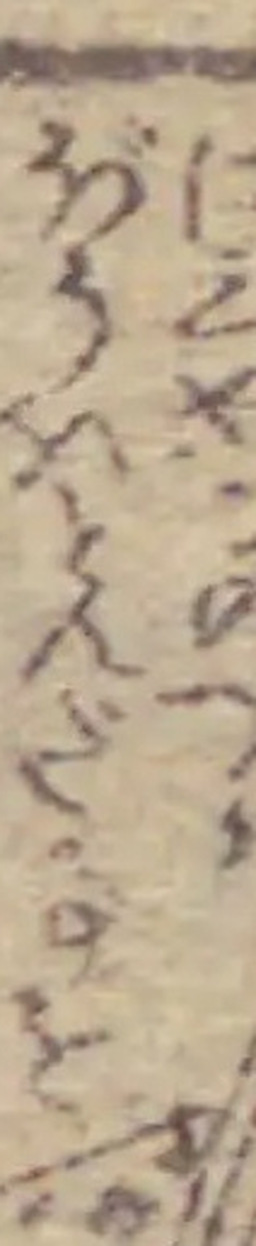ぼうはとんだ事を
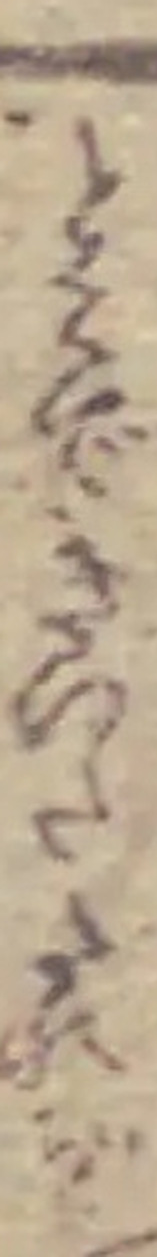とこできいたたれが
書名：夜野中狐物 2巻
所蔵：国立国会図書館 National Diet Library, JAPAN
